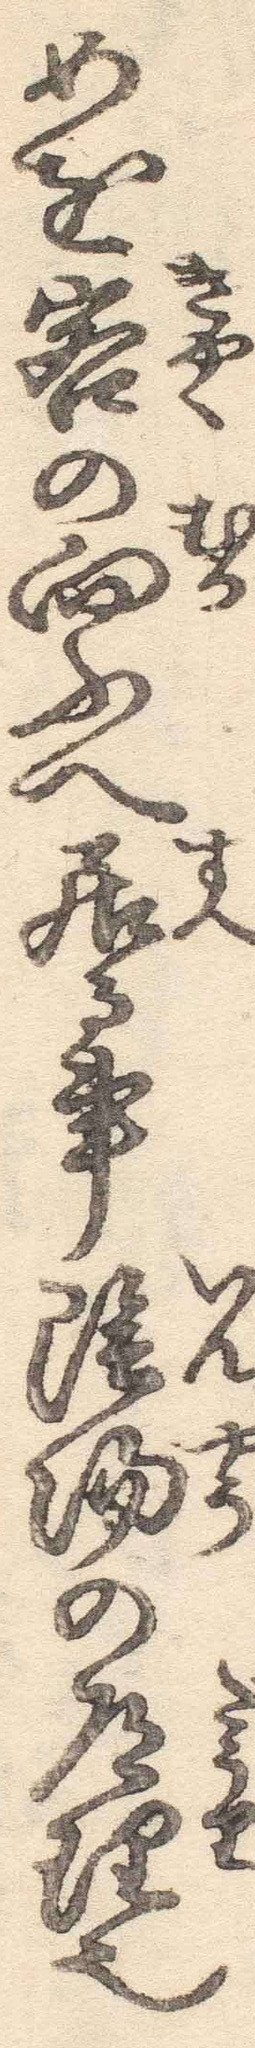めを客の向ふへ居る事陰陽の道理也
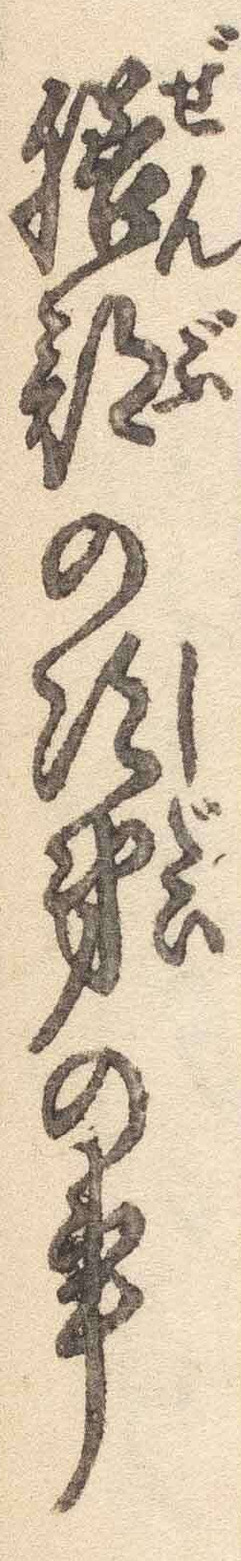膳部の次第の事
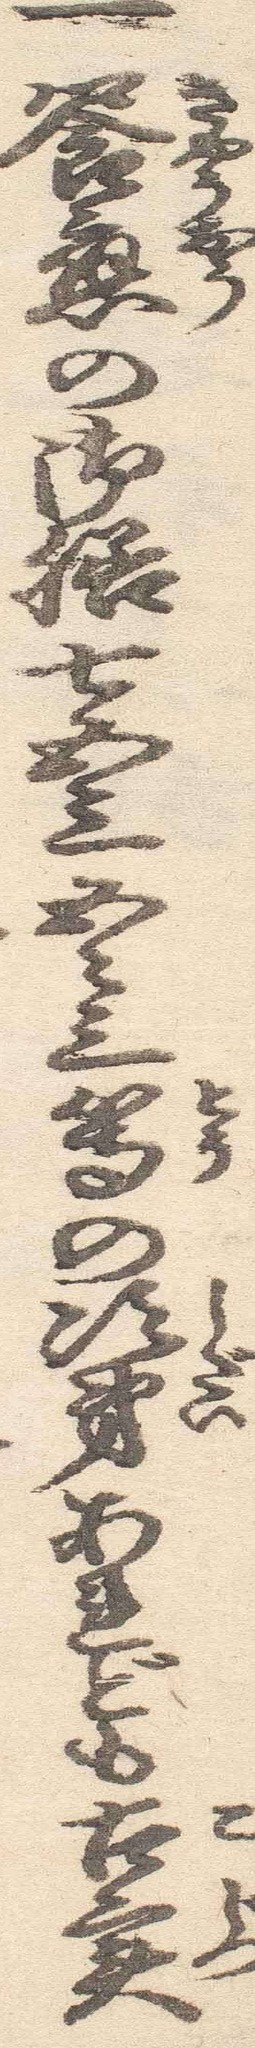一饗応の御膳七五三五々三等の次第あれども古実
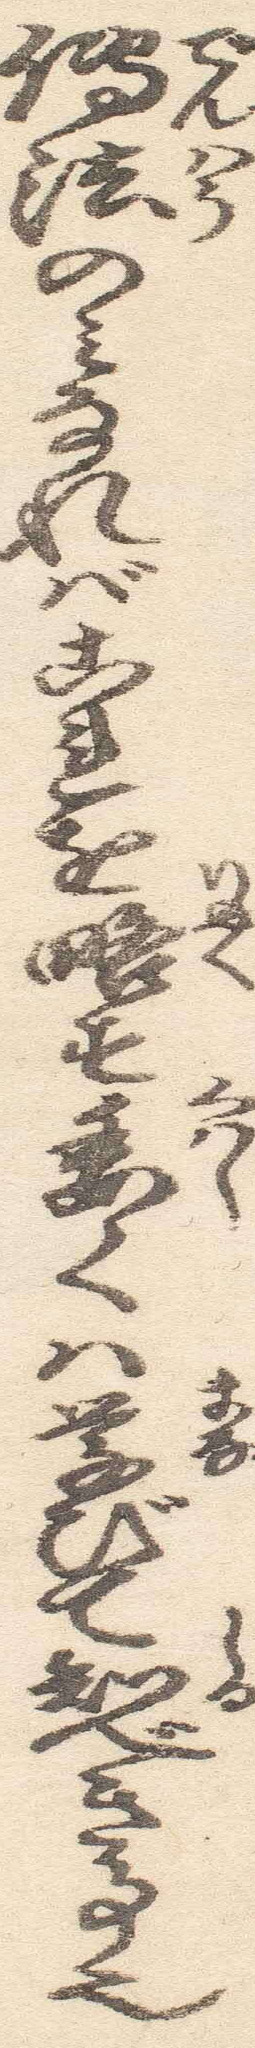伝法のみなればこれを略す委くは学びて知べき事也
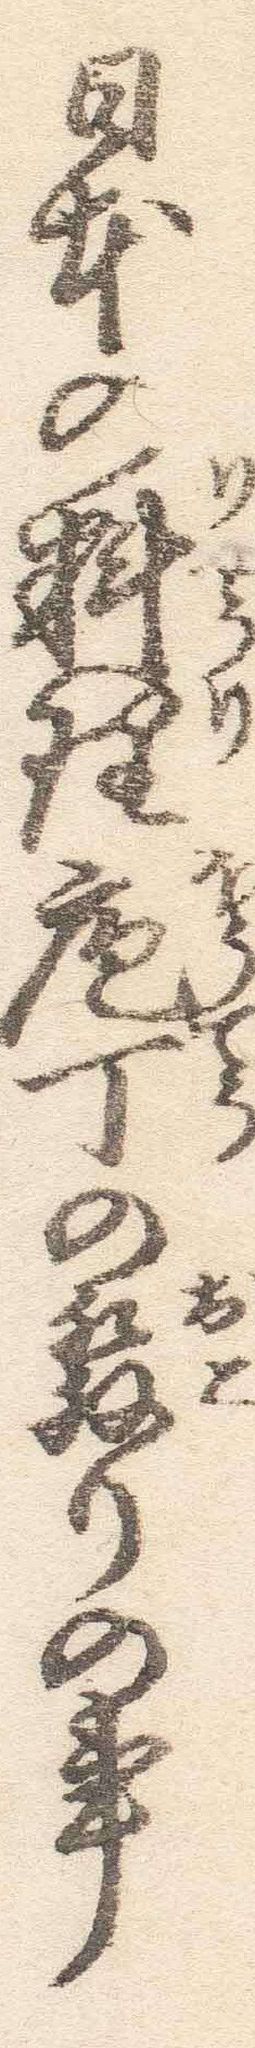日本の料理庖丁の発りの事
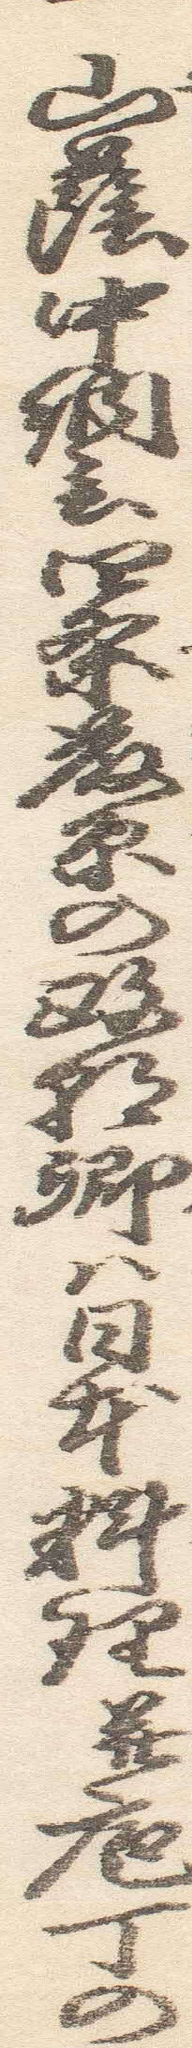一山蔭中納言四条藤原の政朝卿は日本料理并庖丁の
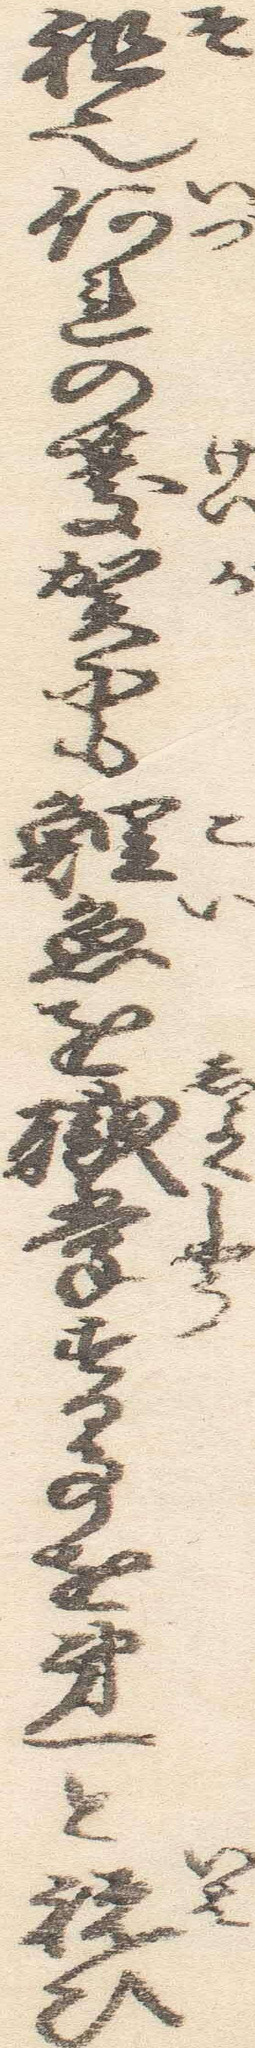祖也何れの慶賀にも鯉魚を職掌する事を第一と祝ひ
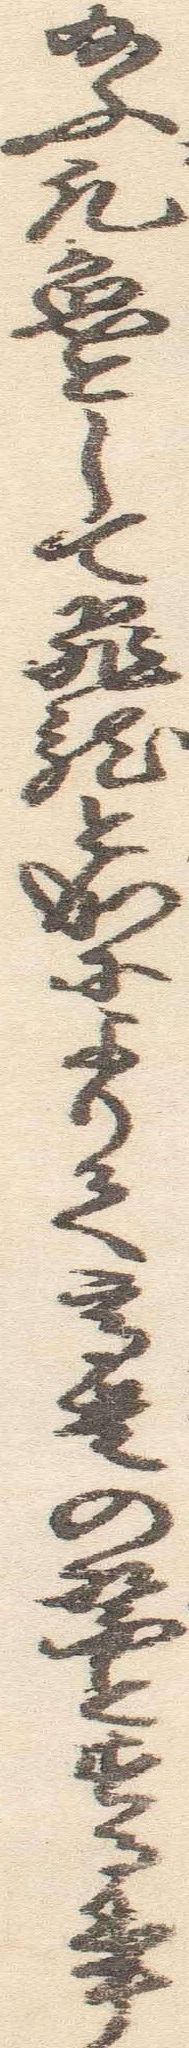給ふ凡魚として飛竜と成によりて高貴の祭とする事
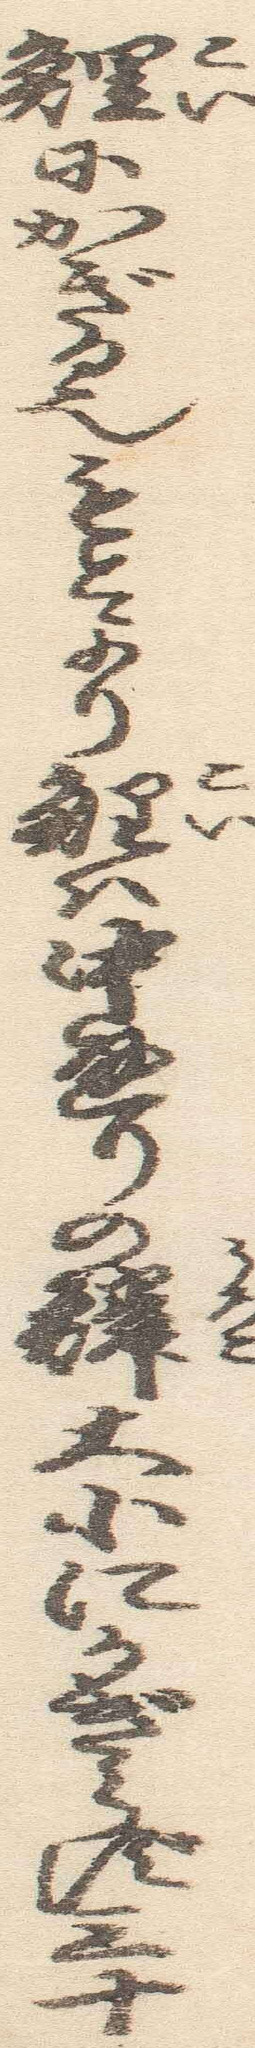鯉にかぎる也もとより鯉は中通りの鱗大小にかぎらず三十
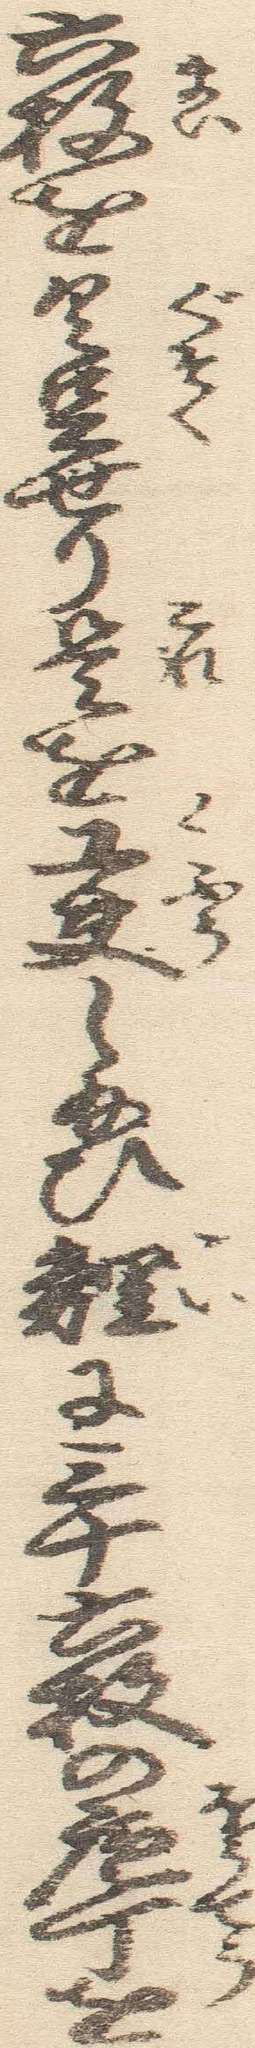六枚を具足せり是を工夫し給ひ鯉に三十六枚の庖丁を
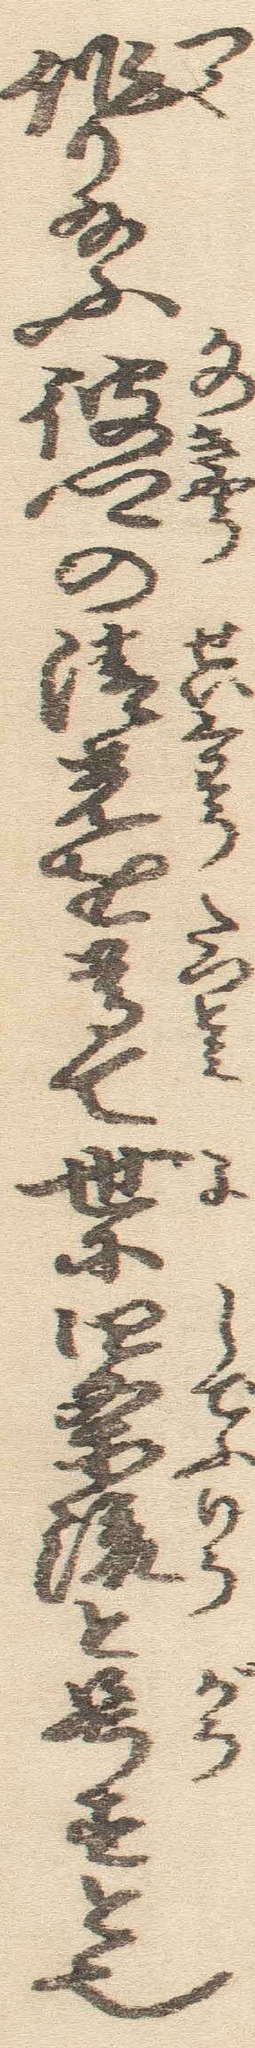作り給ふ彼卿の清光を尊て世に四条流と号すと也

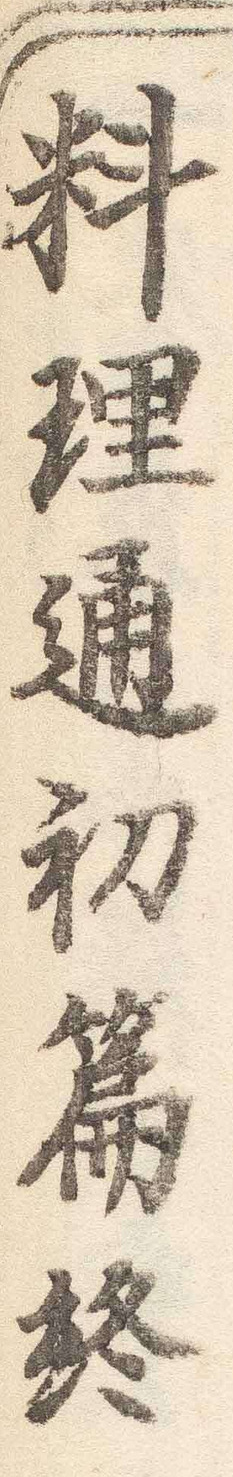料理通初篇終
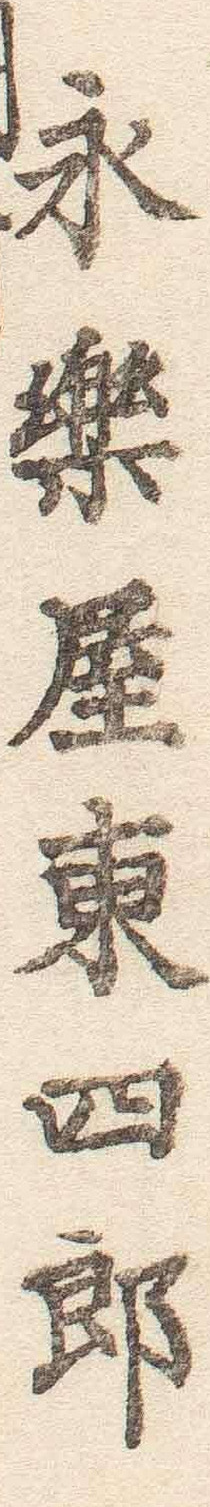永楽屋東四郎
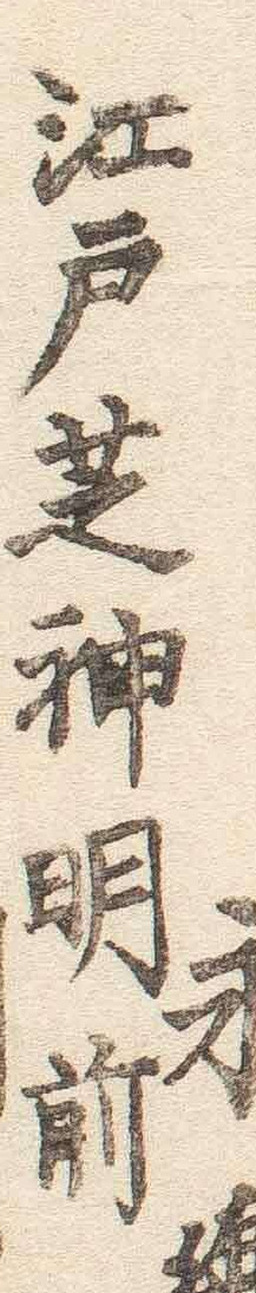江戸芝神明町
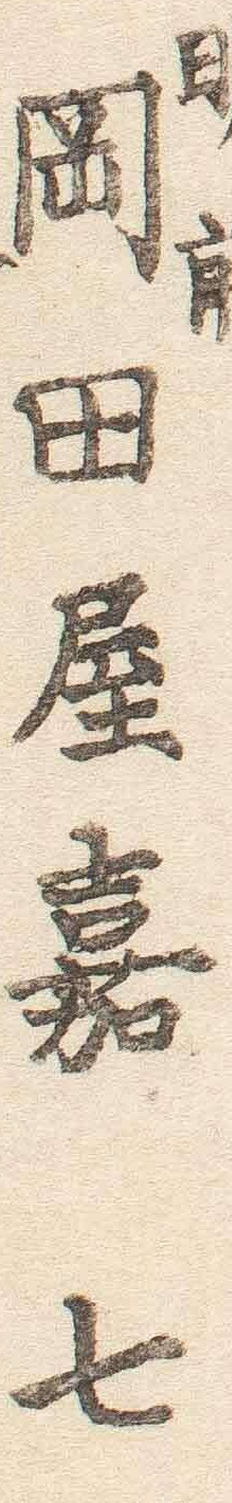岡田屋嘉七
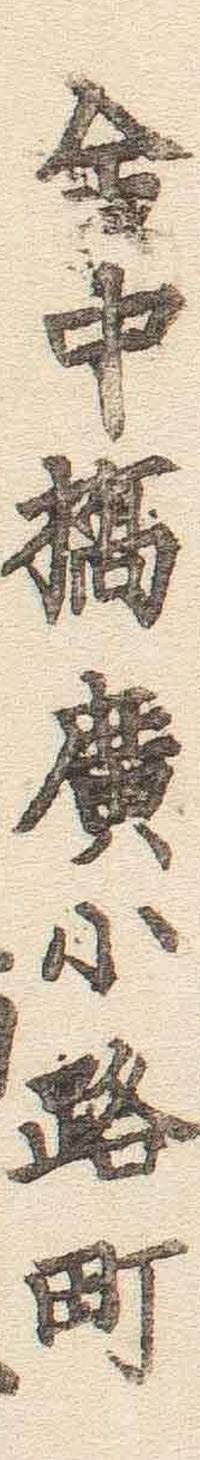書肆同中橋広小路町
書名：料理通
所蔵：東京学芸大学附属図書館 国文学研究資料館
